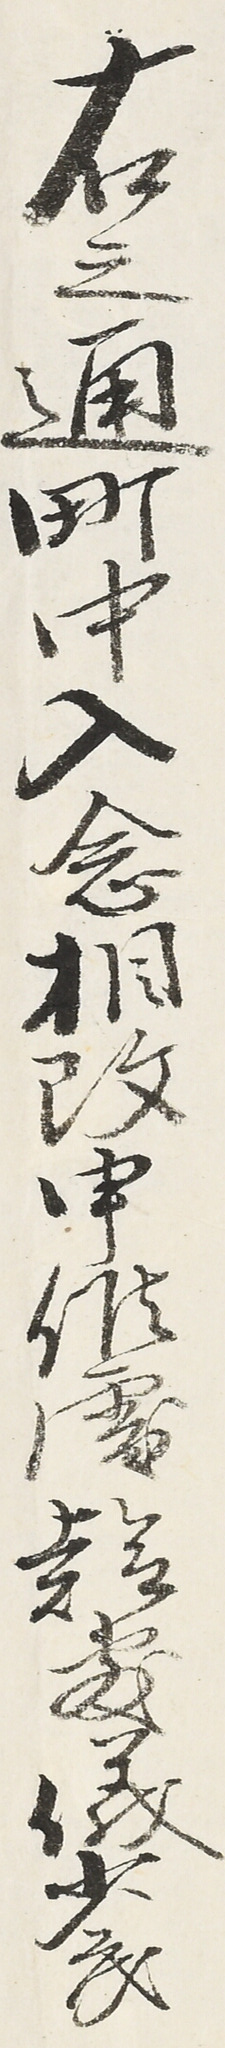右之通町中入念相改申候処疑敷儀少茂
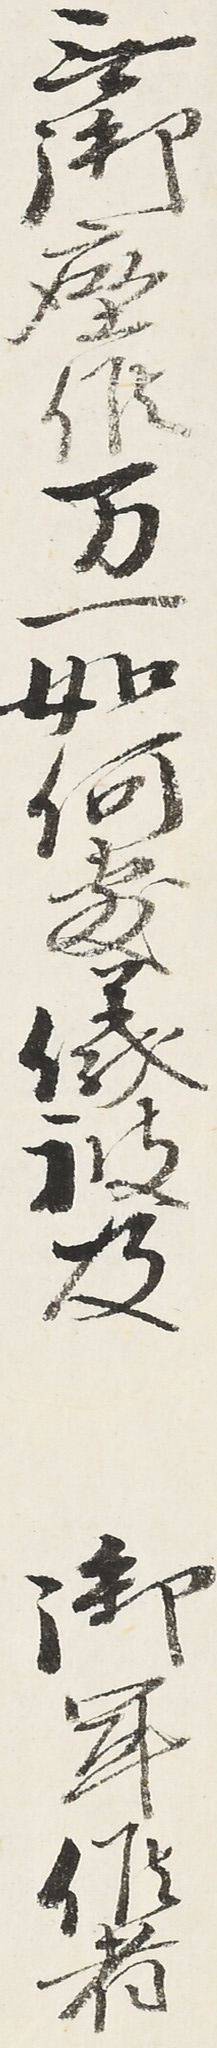無御座候万一如何敷儀被及御聞候者
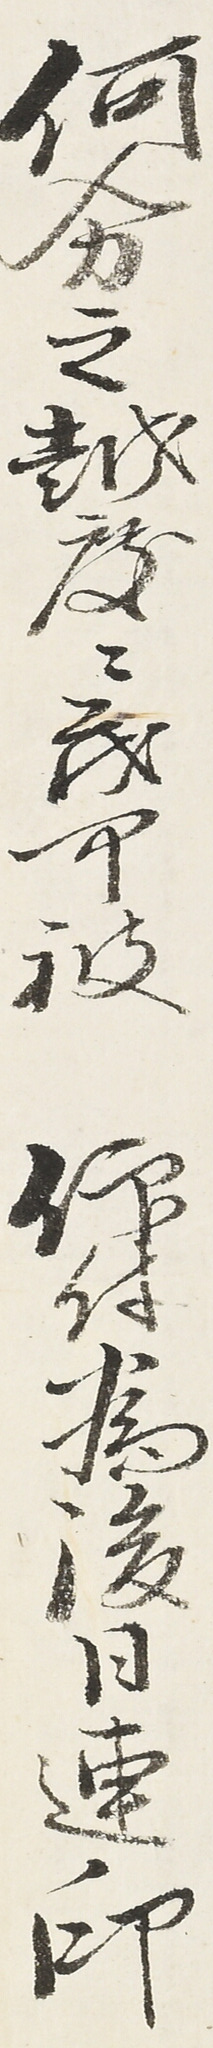何分之越度ニ茂可被仰付為後日之連印
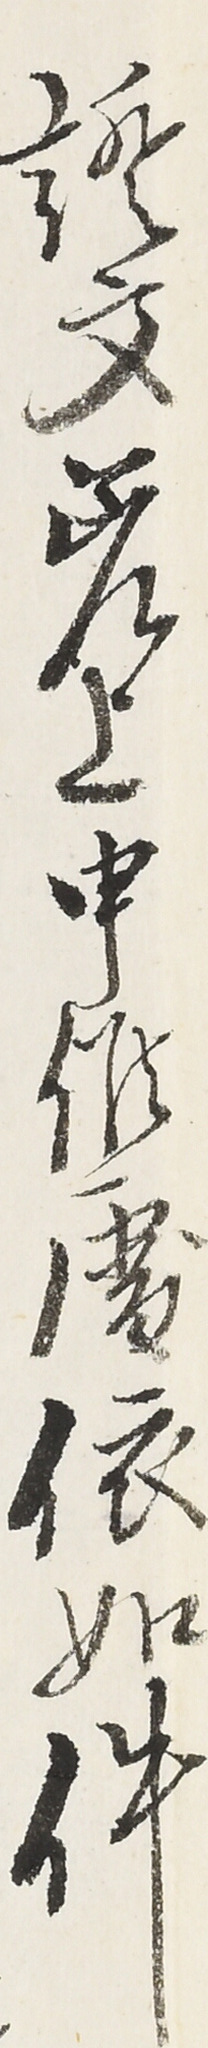証文差上申候処依如件
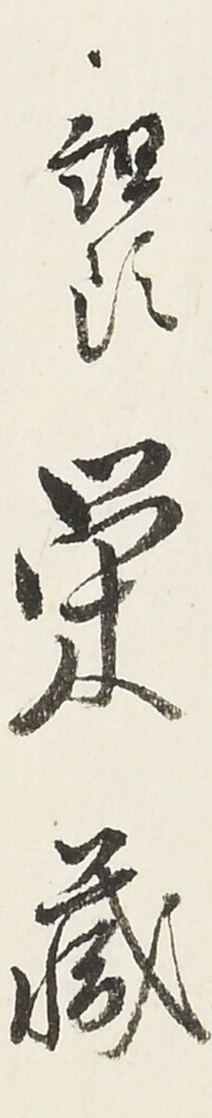組頭栄蔵
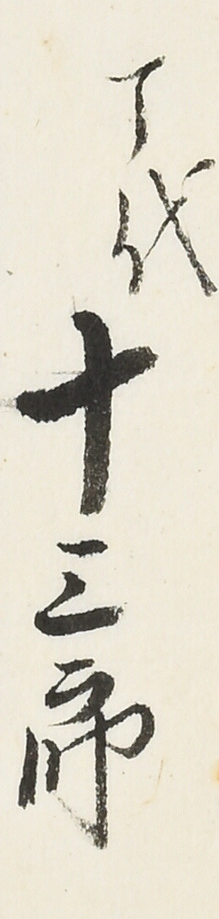丁代十三郎
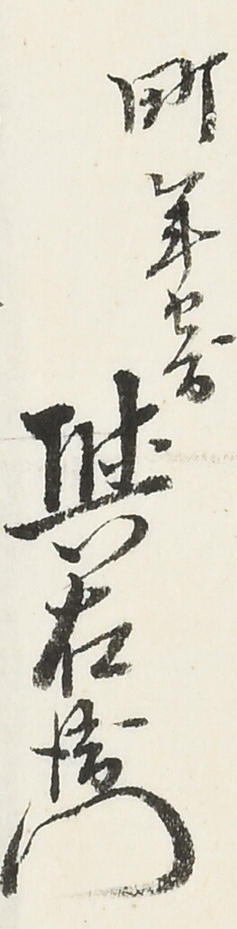町年寄与右衛門
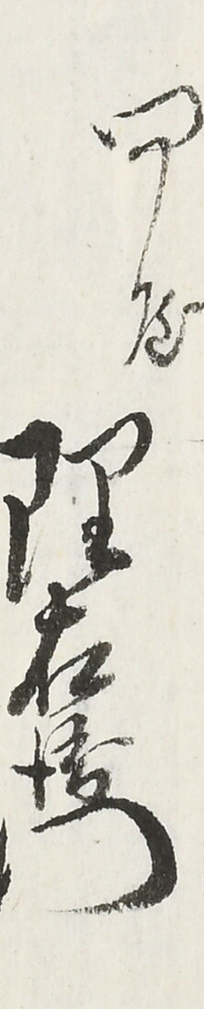問屋理右衛門
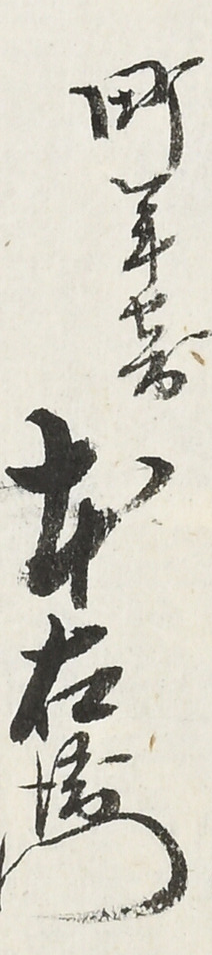町年寄本右衛門
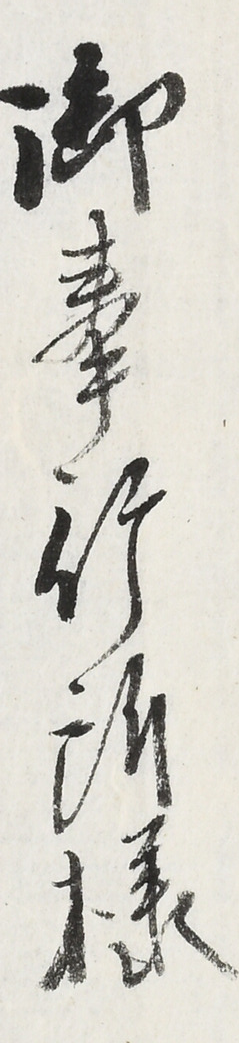御奉行所様

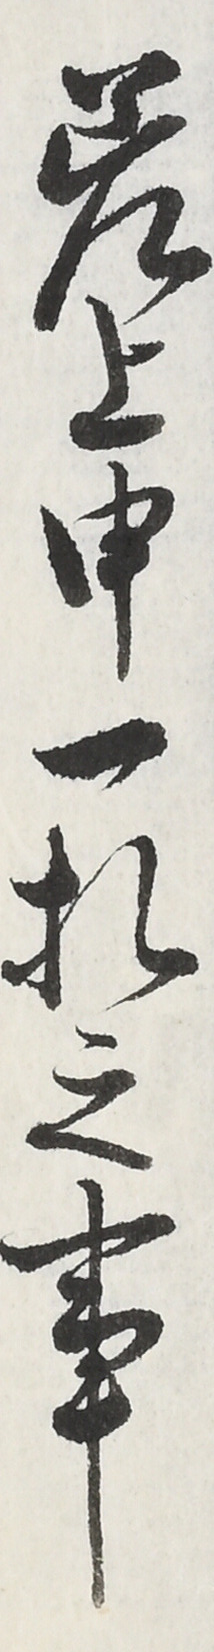差上申一札之事
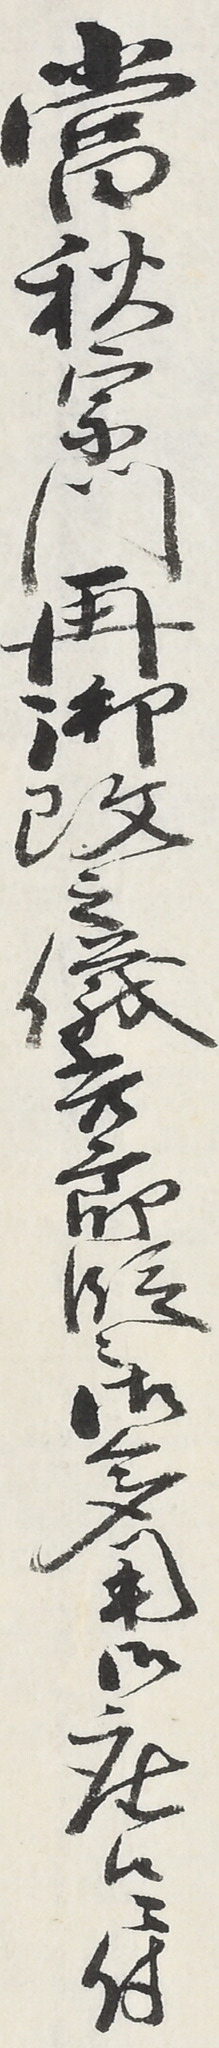当秋宗門再御改之儀此節段々御多用御座候ニ付
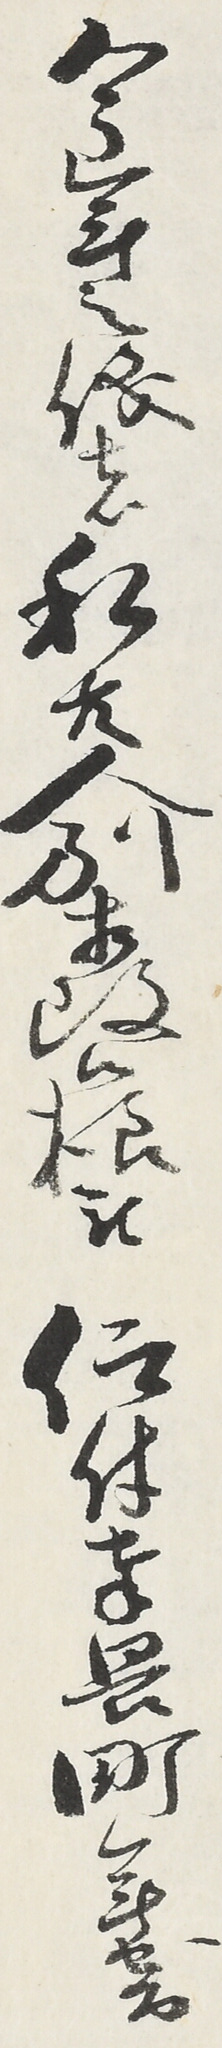今年之儀者私共人別相改候様被仰付奉畏町年寄
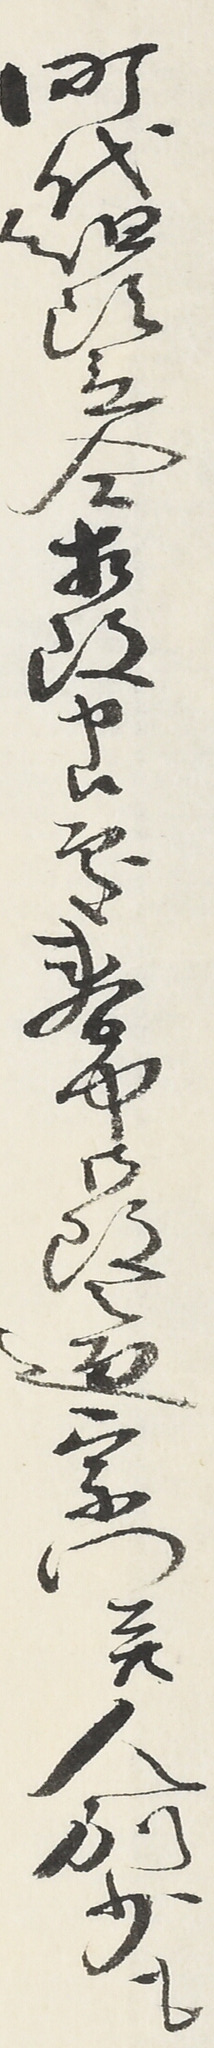町代組頭立合相改申候処春中御改之通宗門幷人別少も
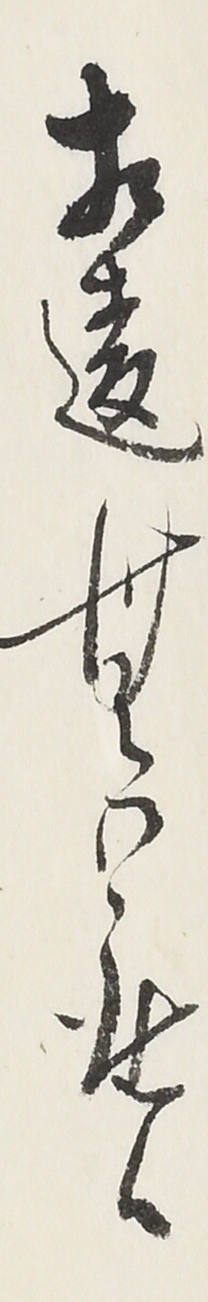相違無御座候
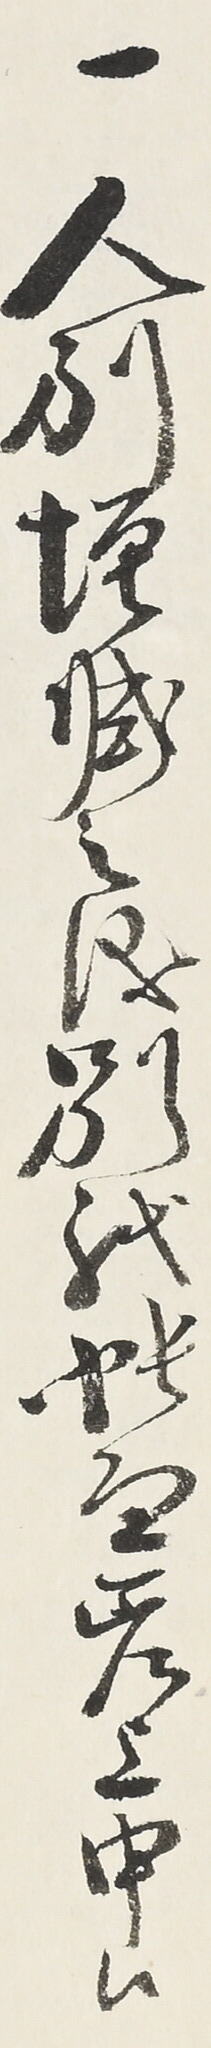一人別増減之儀別紙帳面差上申候
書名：差上申一札之事
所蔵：伊那市立高遠町図書館・合同会社AMANE
